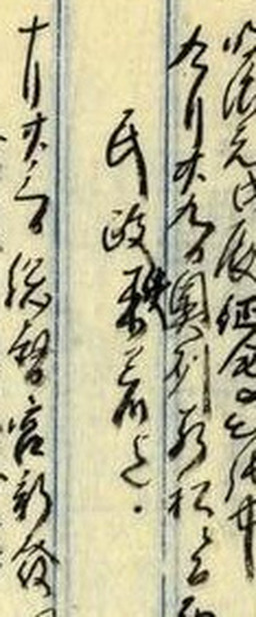民政来着迄
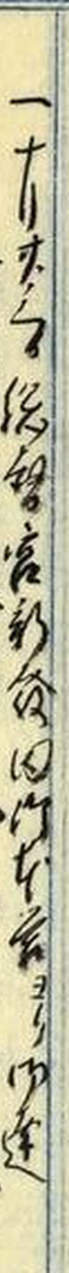一十月廿三日総督宮新発田御本営ヨリ御達
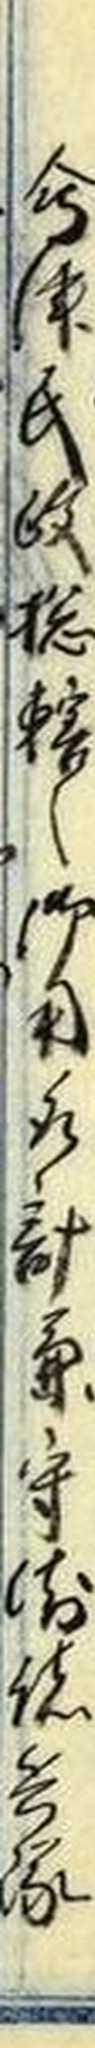会津民政総轄之御用取計兼守衛諸兵隊
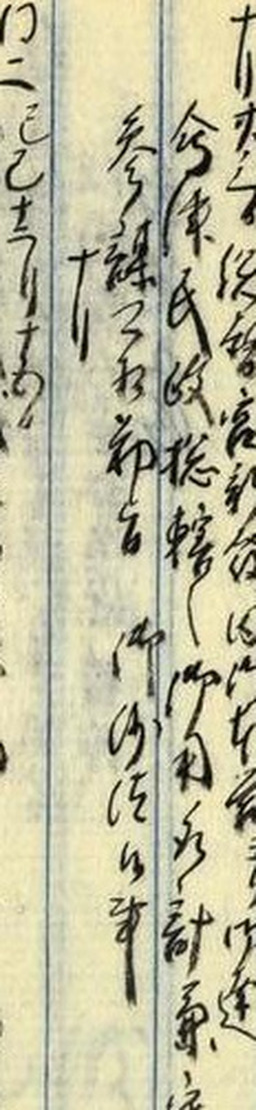参謀可相勤旨御沙汰候事
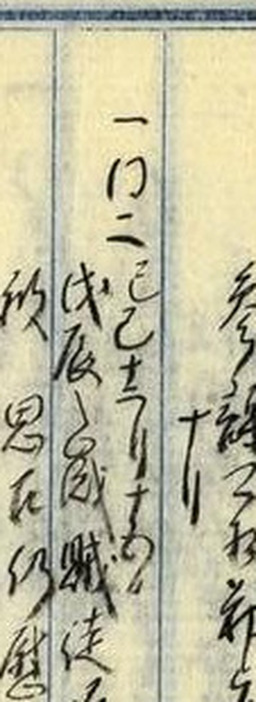一同二己巳十二月十五日
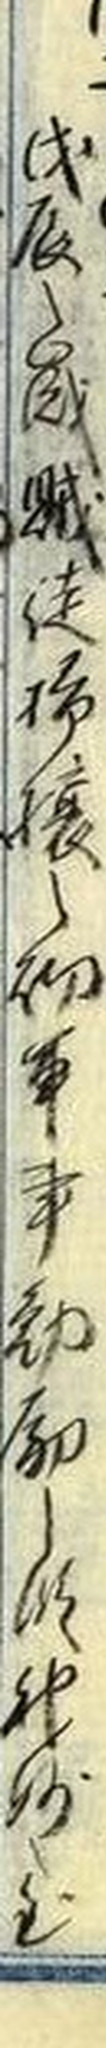戊辰之歳賊徒掃攘之砌軍事勉励之段神妙之至
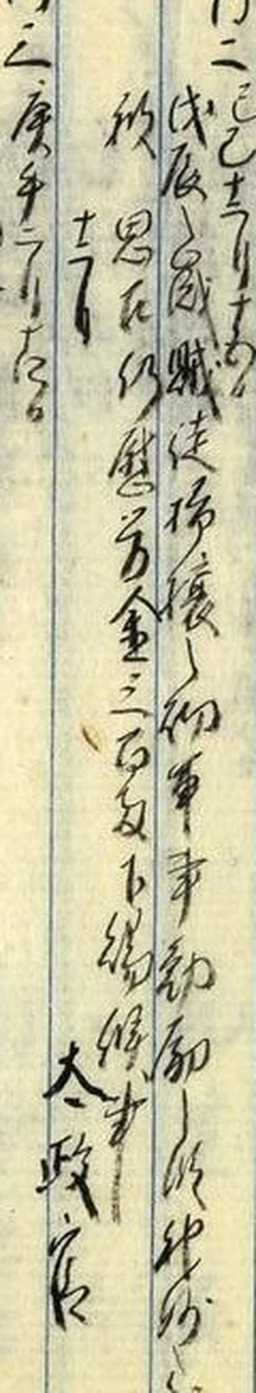被思召仍慰労金三百両下賜候事
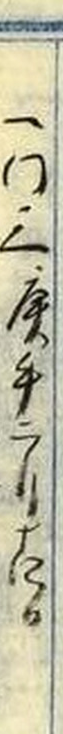一同三年庚午二月十四日
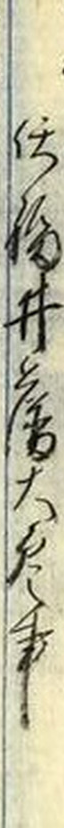任福井藩大参事
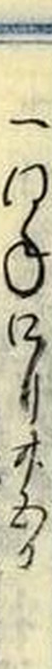一同年四月廿五日
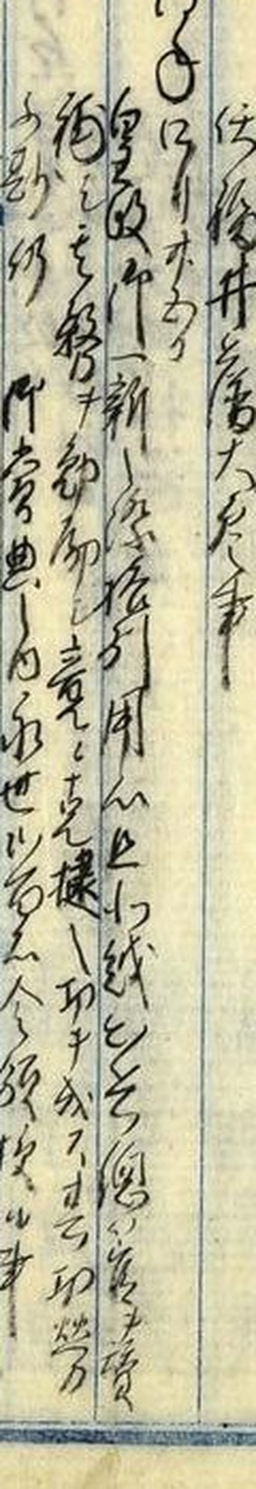皇政御一新之際格別用心且北越出兵総管ヲ賛
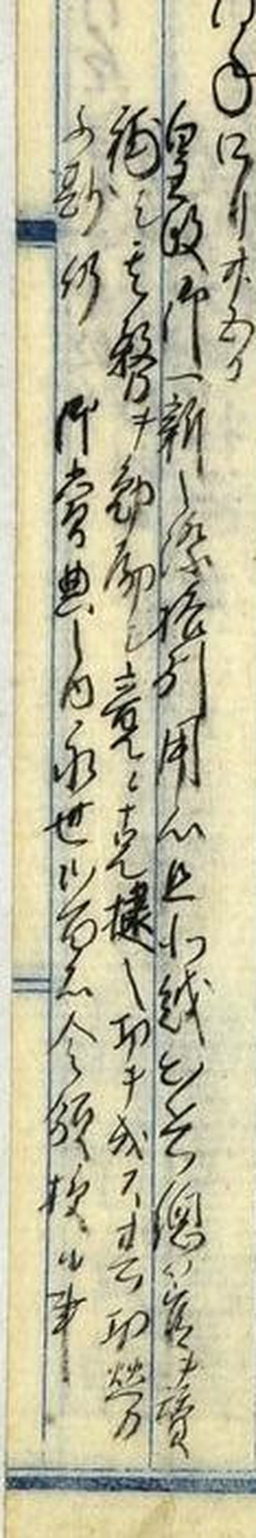補シ其務ヲ勉励シ竟ニ克捷之功ヲ成ス其功労
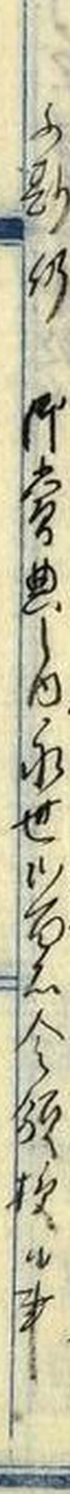不尠仍御賞典之内永世弐百石令領授候事

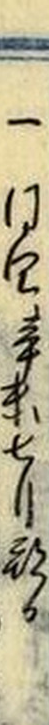一同四辛未七月朔日
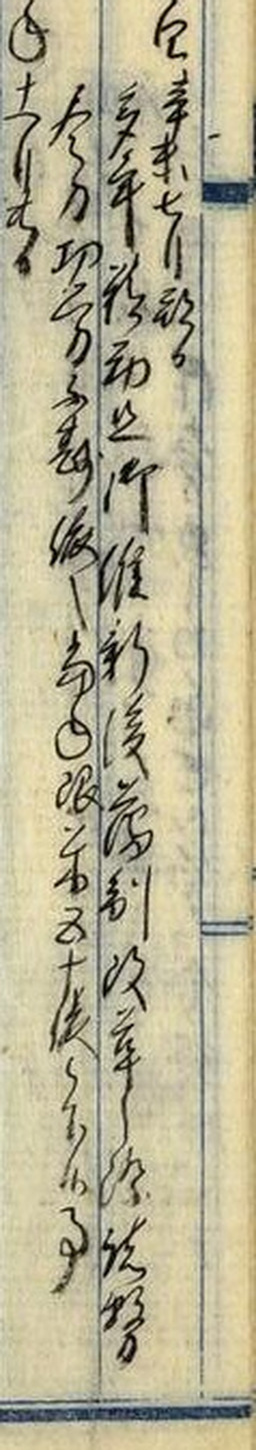多年精勤且御維新後藩制改革之際諸務
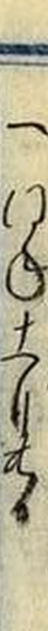一同年十一月廿日
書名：温古集 三巻
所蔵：福井県文書館 Fukui Prefectural Archives
